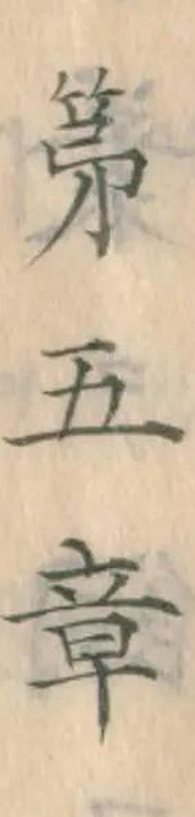第五章
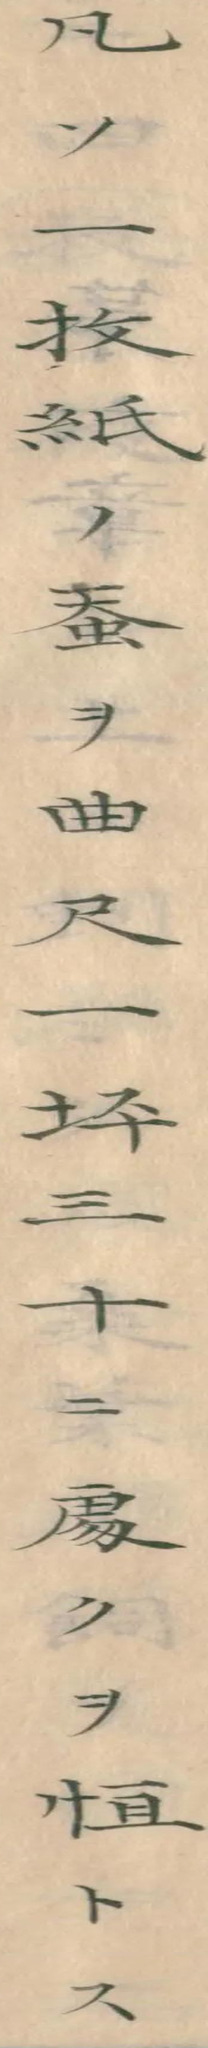凡ソ一枚紙ノ蚕ヲ曲尺一坪三十ニ処クヲ恒トス
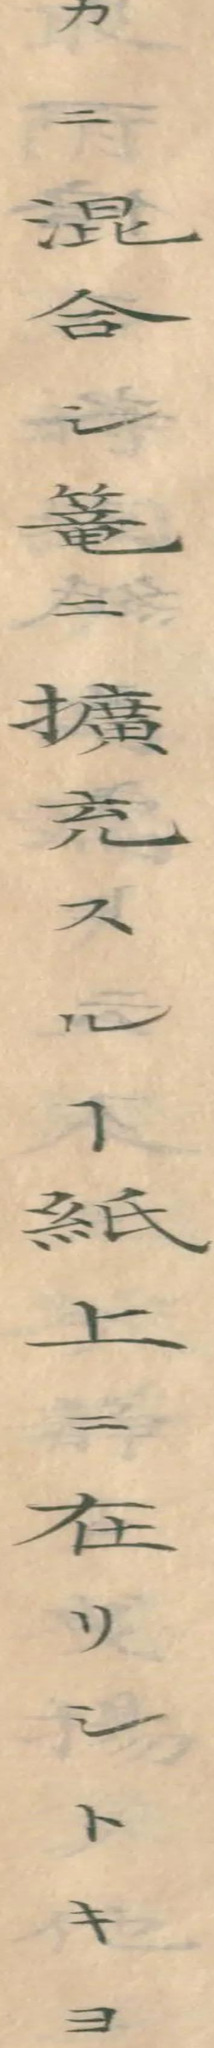カニ混合シ篭ニ拡充スルコト紙上ニ在リシトキヨ

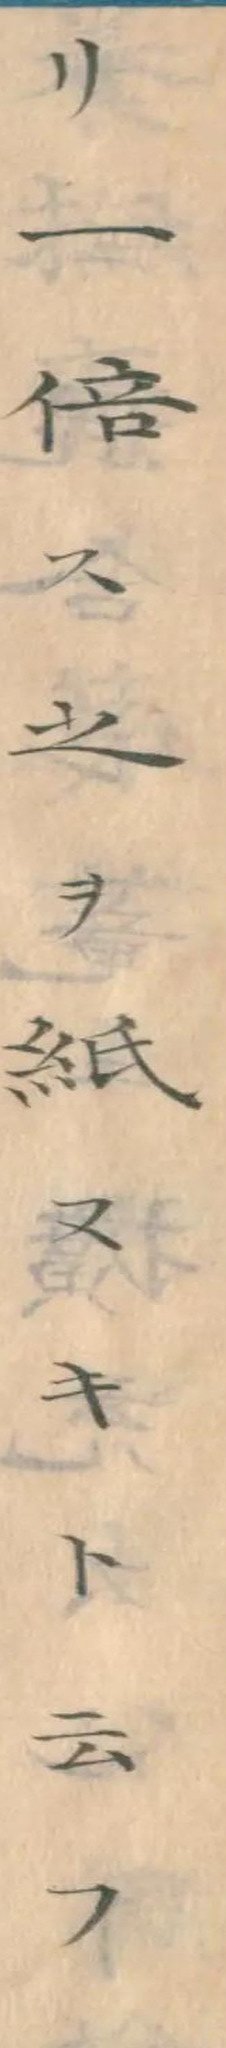リ一倍ス之ヲ紙ヌキト云フ
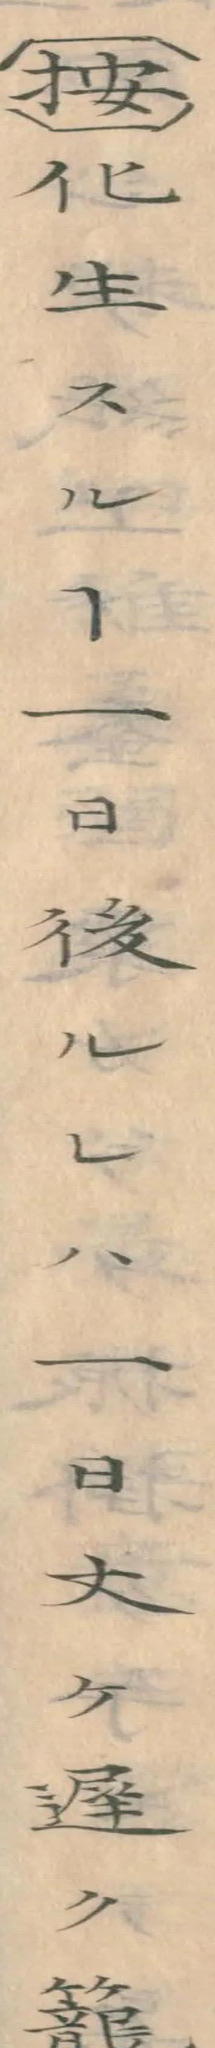[按]化生スルコト一日後ルレハ一日丈ケ遅ク籠
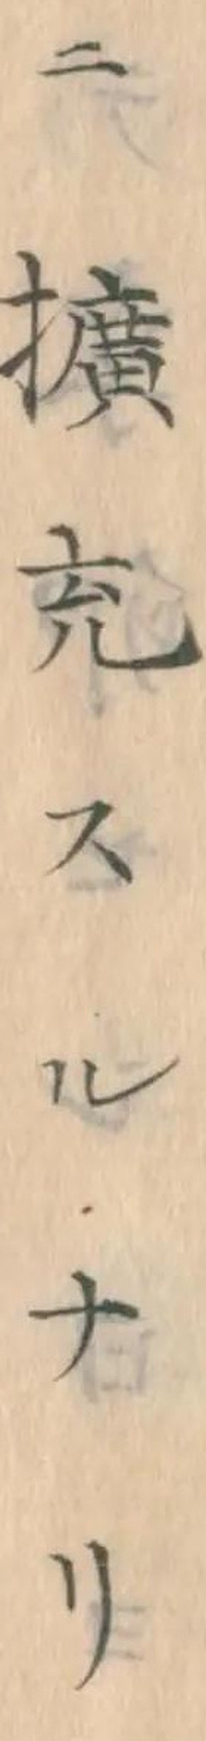ニ拡充スルナリ
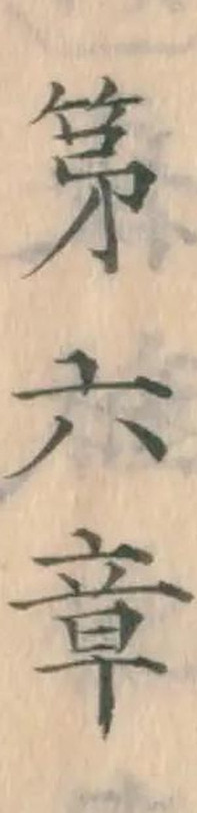第六章
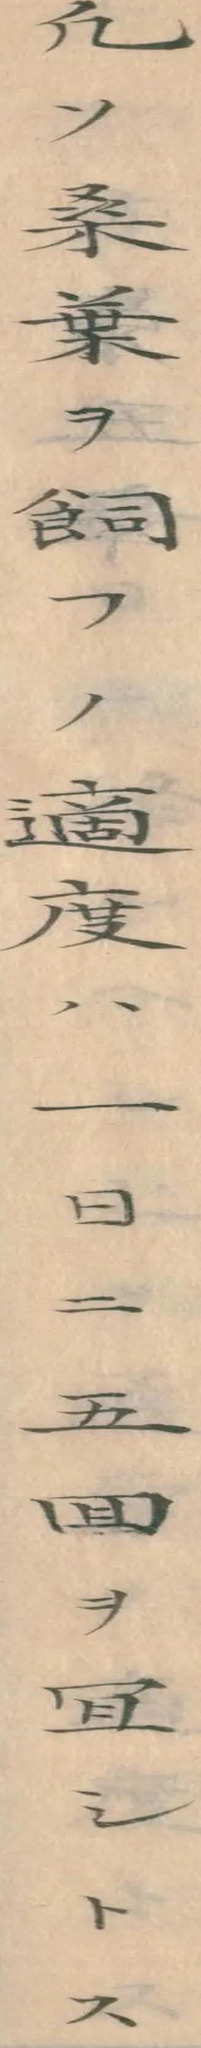凡ソ桑葉ヲ飼フノ適度ハ一日ニ五回ヲ宜シトス
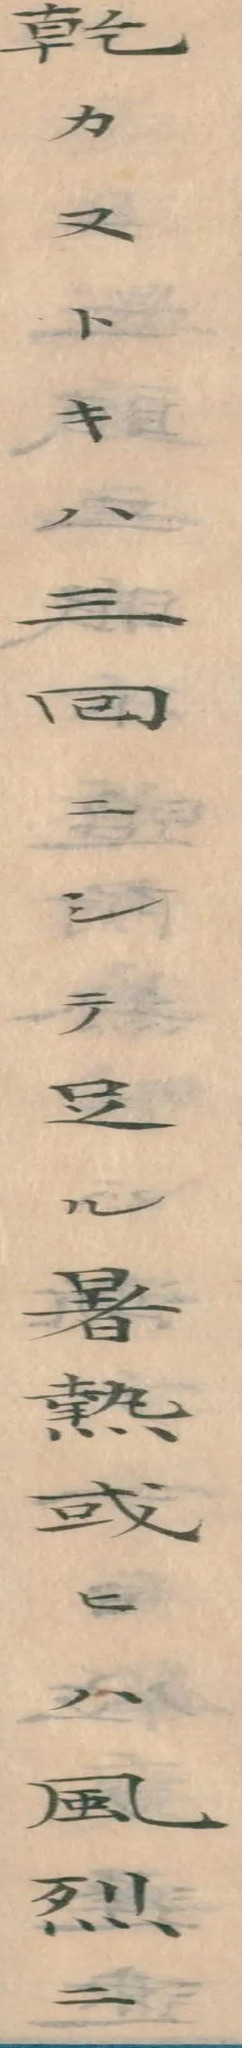乾カヌトキハ三回ニシテ足ル暑熱或ヒハ風烈ニ
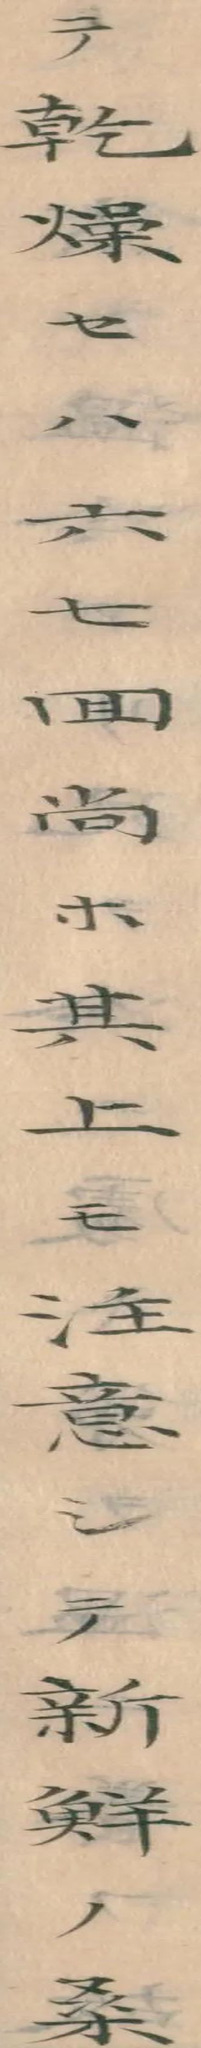テ乾燥セハ六七回尚ホ其上モ注意シテ新鮮ノ桑
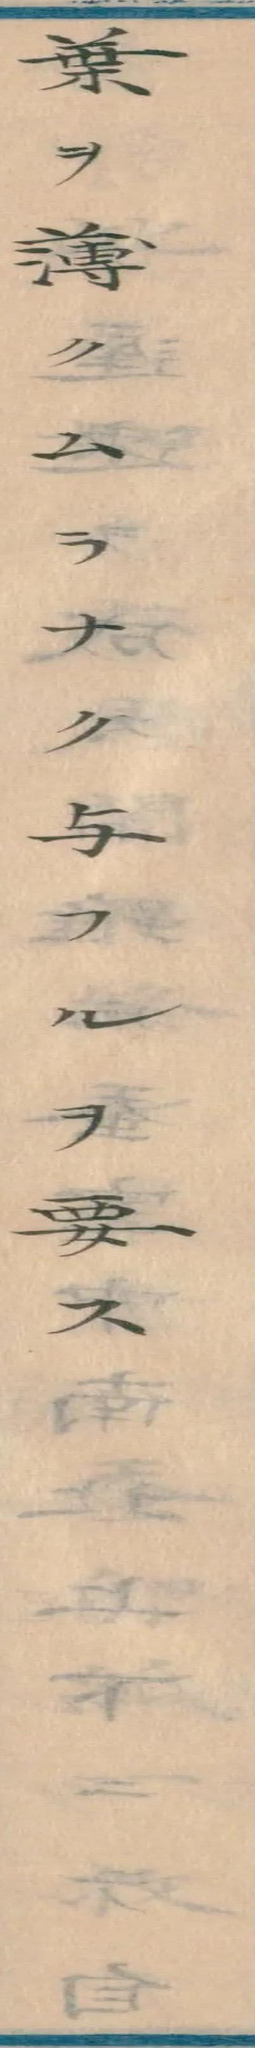葉ヲ薄クムラナク与フルヲ要ス
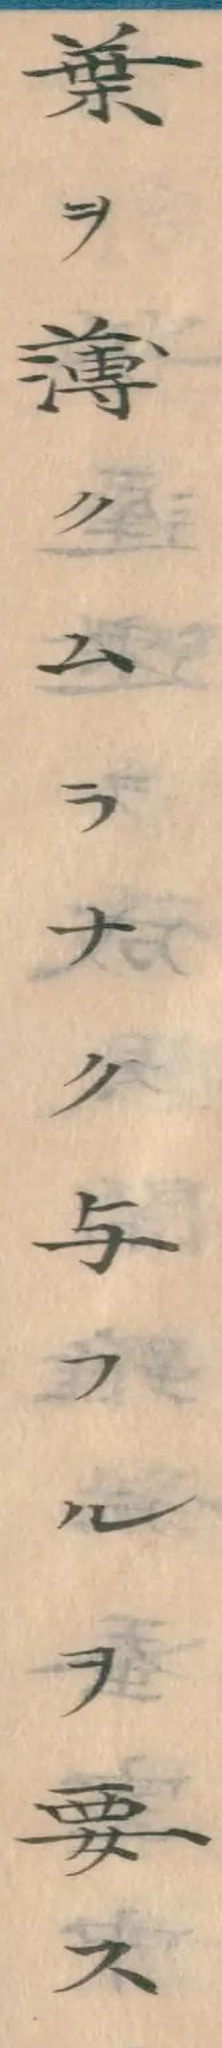葉ヲ薄クムラナク与フルヲ要ス
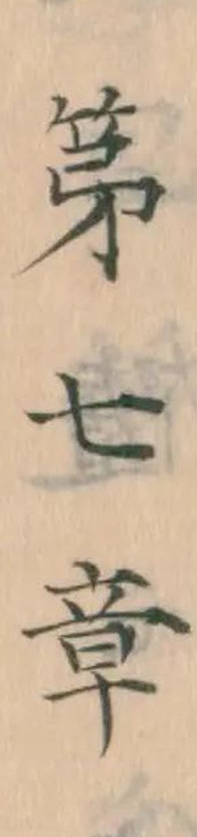第七章
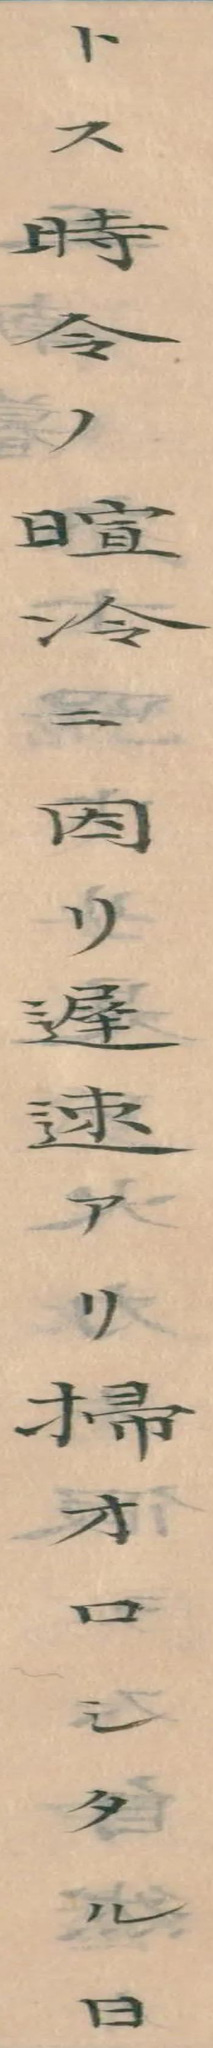トス時令ノ暄冷ニ因リ遅速アリ掃オロシタル日
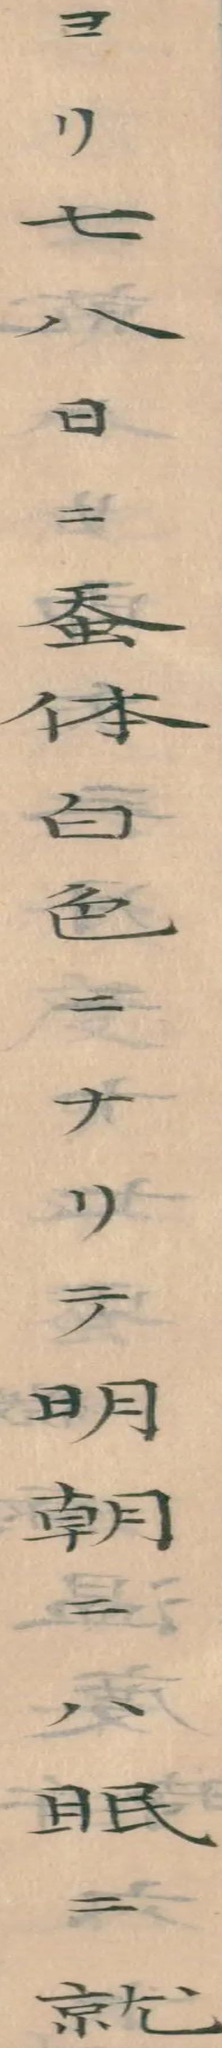ヨリ七八日ニ蚕体白色ニナリテ明朝ニハ眠ニ就
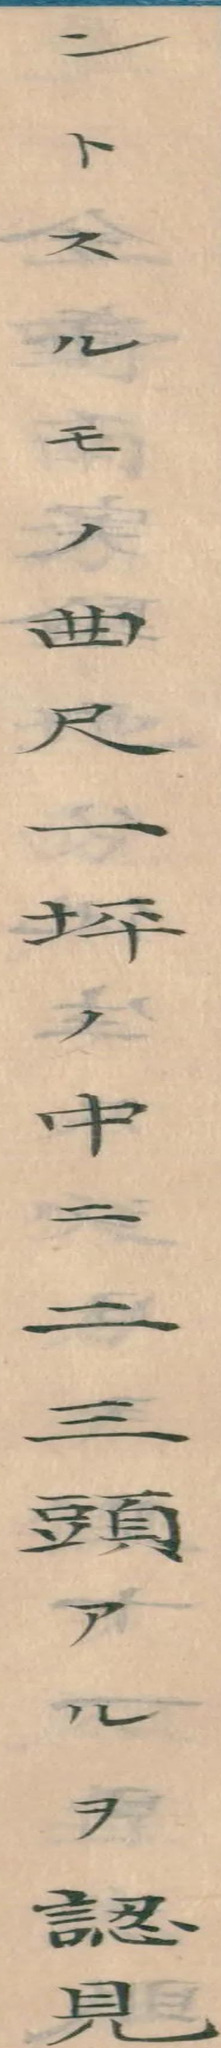ントスルモノ曲尺一坪ノ中ニ二三頭アルヲ認見
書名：蚕桑集成
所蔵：国立国会図書館 National Diet Library, JAPAN
